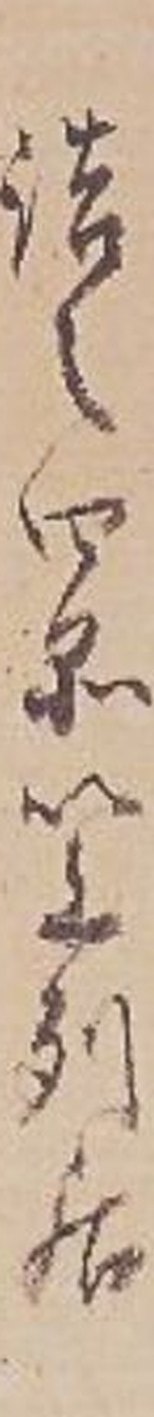法之四品以上列居
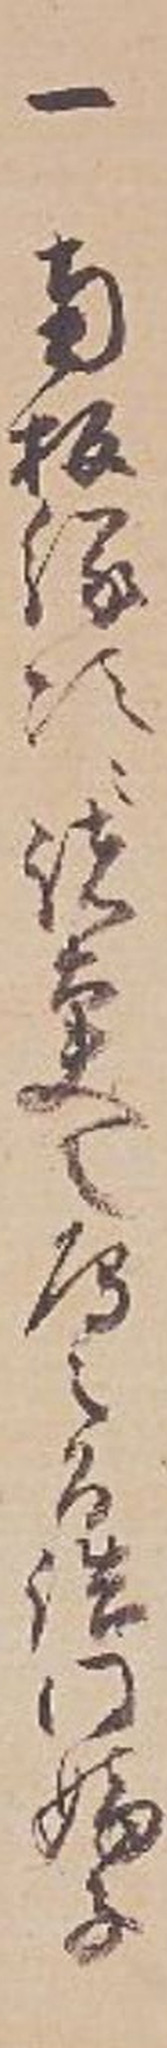一南板縁次に諸大夫之雁之間詰同嫡子
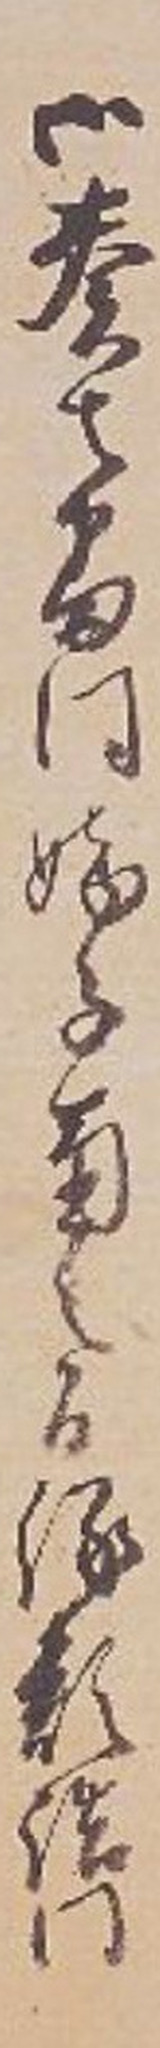御奏者番同嫡子菊之間縁頬詰同
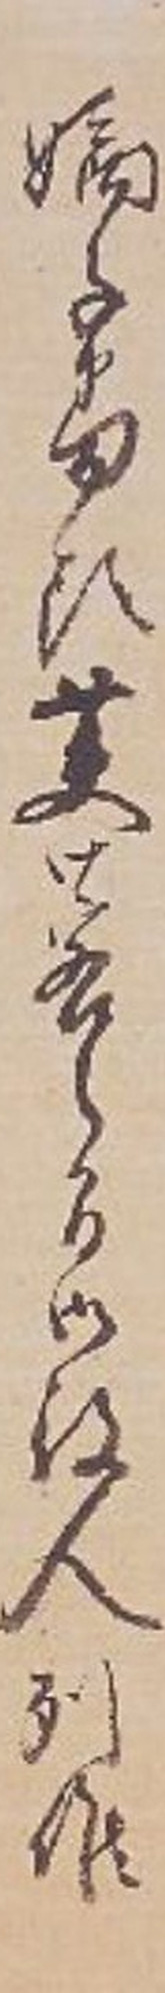嫡子番頭芙蓉之間御役人列候
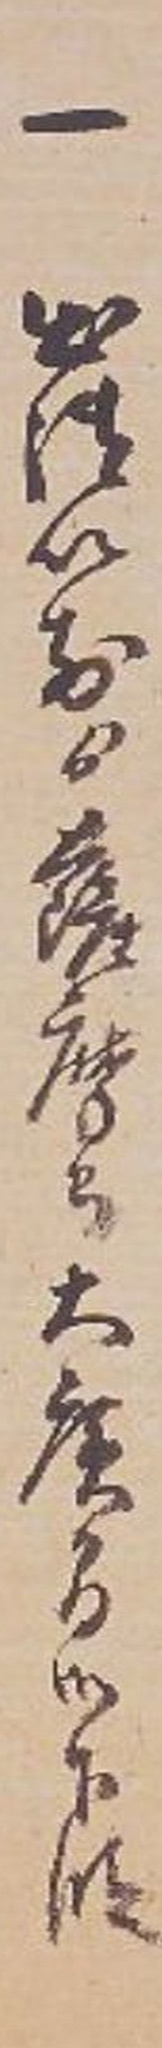一出御以前ゟ薩摩守大広間御下段
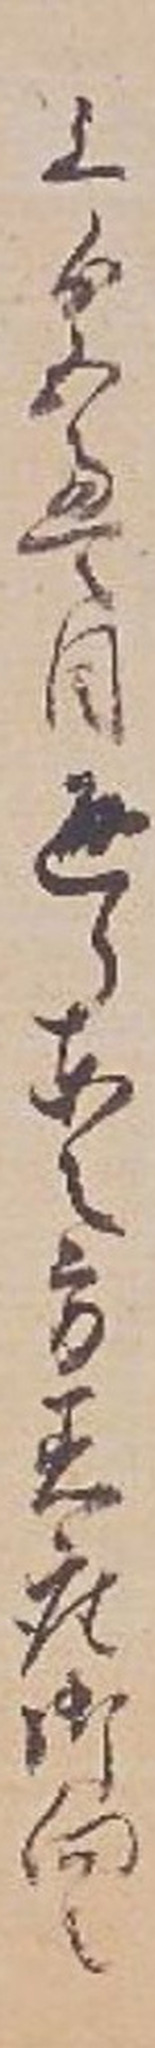上ゟ五畳目通り東之方着座御向之
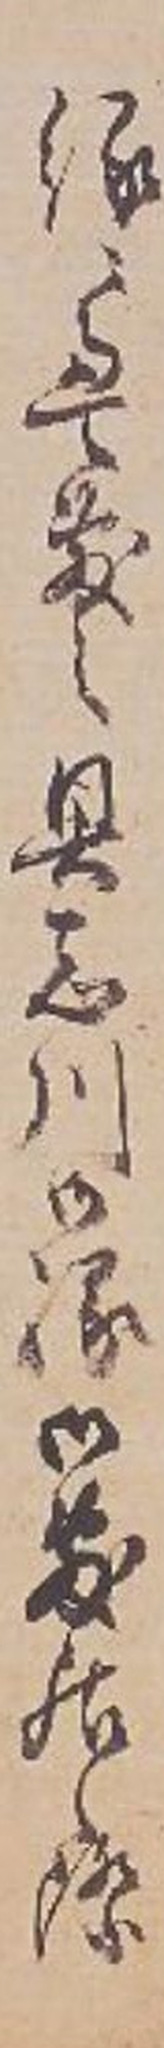縁に畳敷之具志川御縁御敷居之際
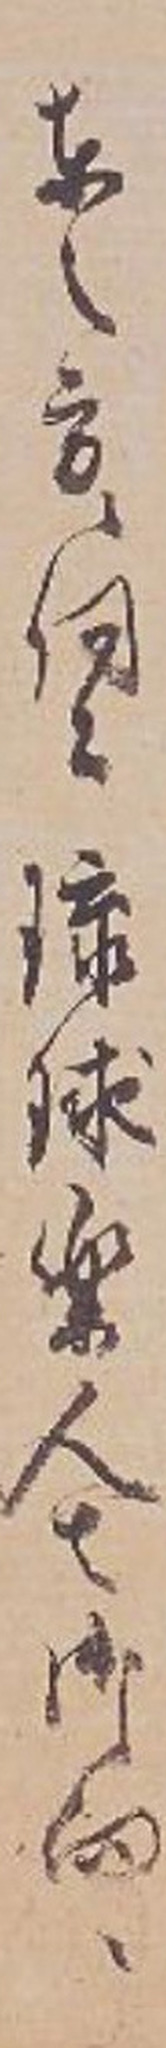東之方に伺公琉球楽人は御向へ

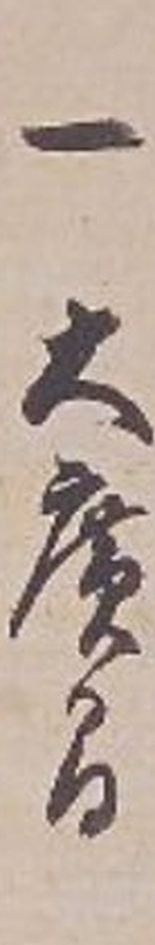一大広間
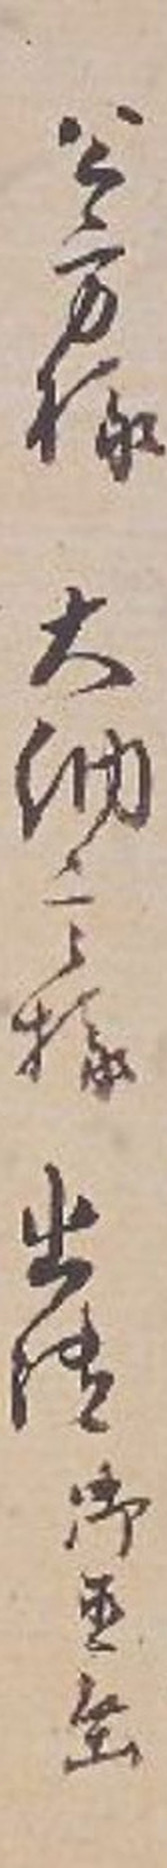公方様大納言様出御御直垂
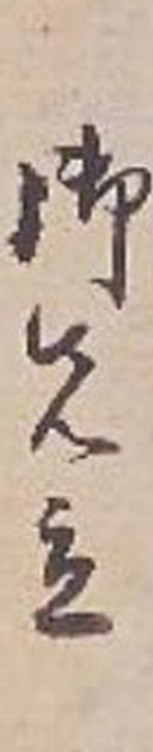御先立
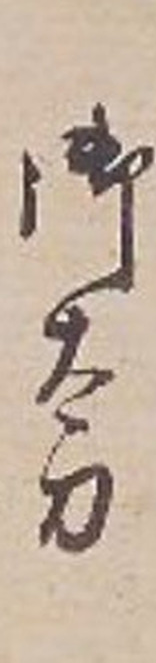御太刀
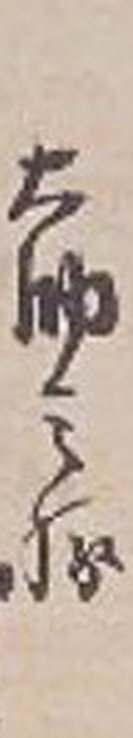大納言様
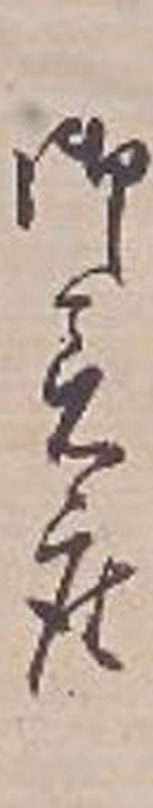御着座

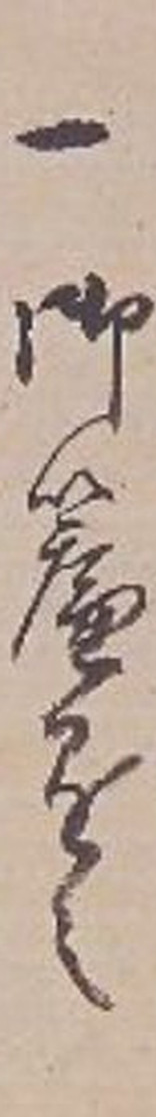一御簾懸之
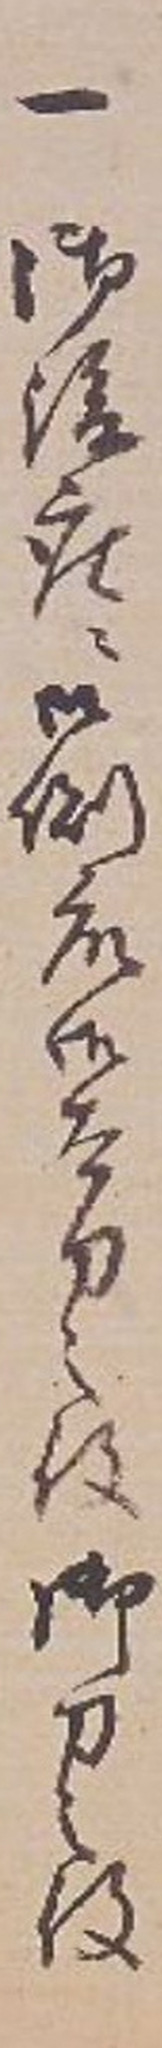一御後座に御側衆御太刀之役御刀之役
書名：琉球人来朝記 八、九
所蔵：University of the Ryukyus Library
